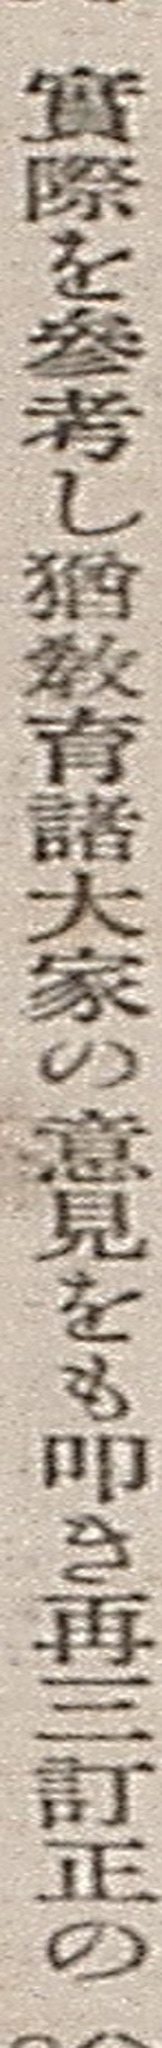実際を参考し猶教育諸大家の意見をも叩き再三訂正の
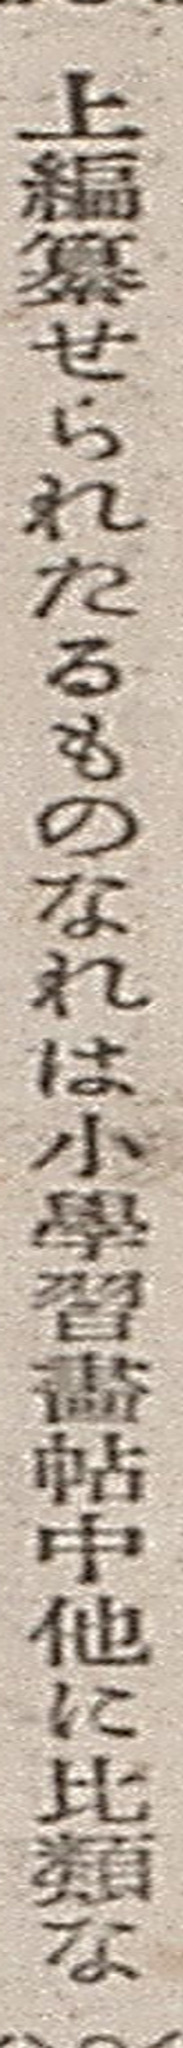上編纂せられたるものなれは小学習畫帖中他に比類な
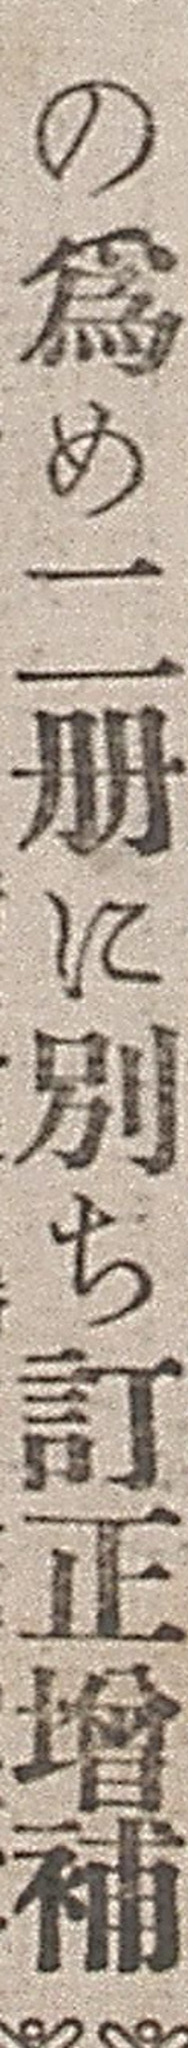の為め二冊に別ち訂正増補
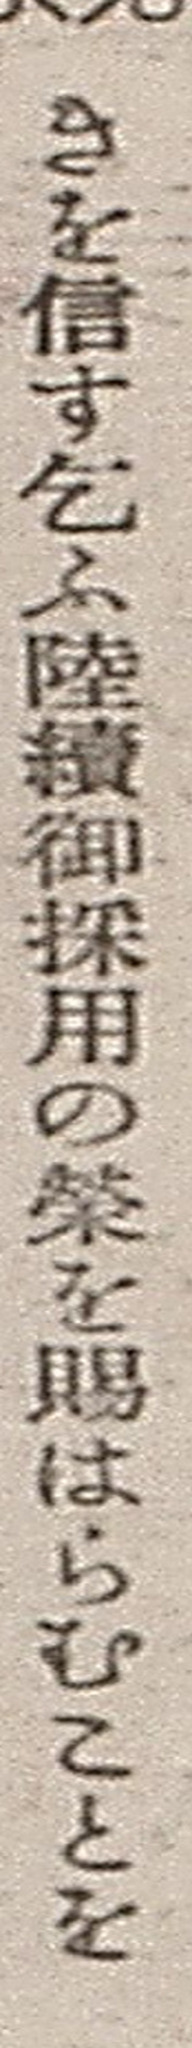きを信す乞ふ陸続御採用の栄を賜はらむことを
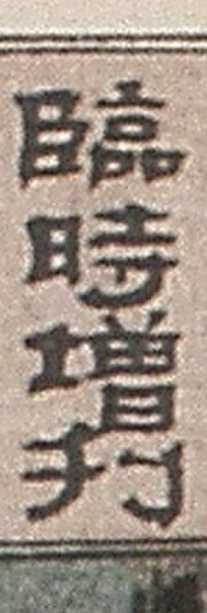臨時増刊

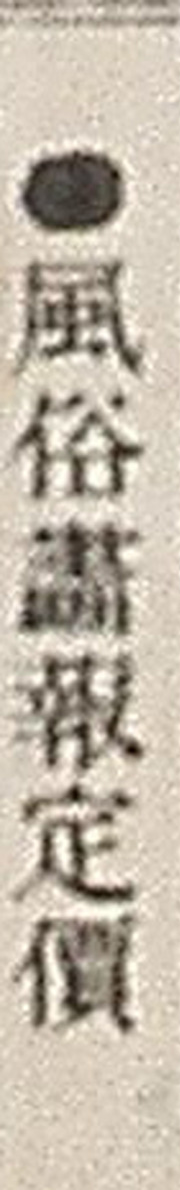●風俗畫報定価
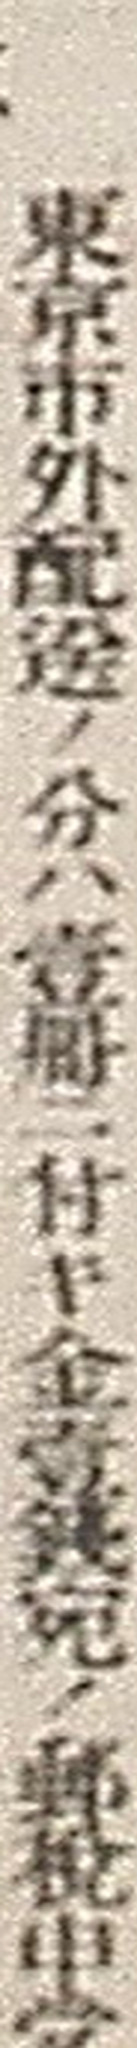注意東京市外配送の分は壹冊に付き金壹銭宛の郵税申受
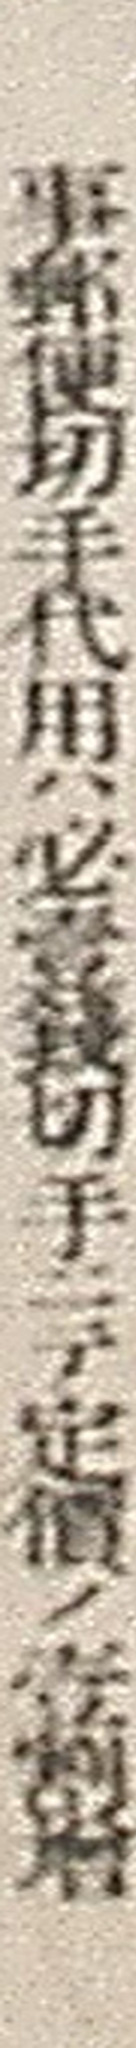事郵便切手代用は必壹銭切手にて定価の壹割増
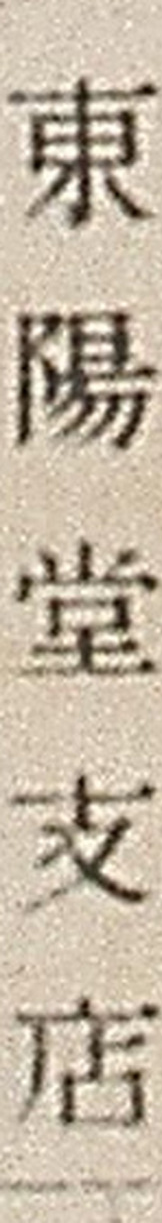東陽堂支店
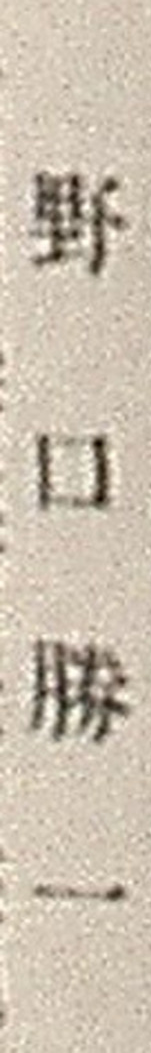野口勝一

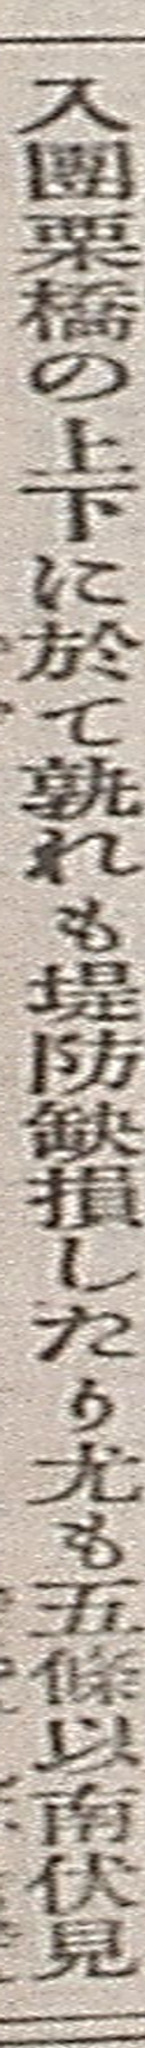入團栗橋の上下に於て孰れも堤防缺損したり尤も五條以南伏見
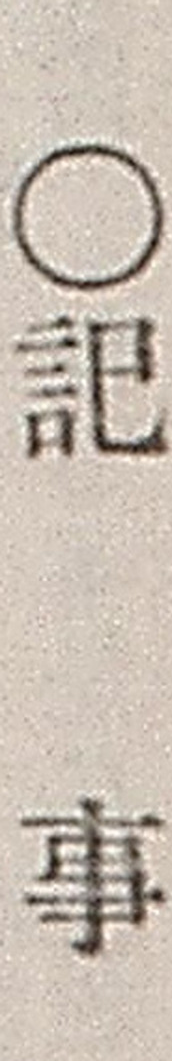◯記事
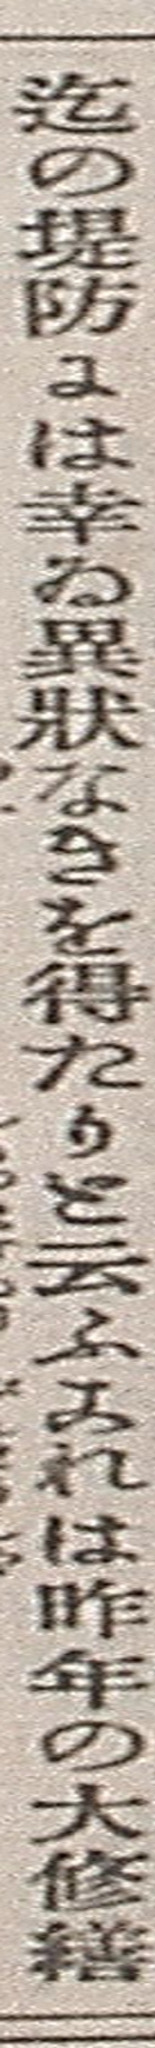迄の堤防には幸ゐ異状なきを得たりと言ふこれは昨年の大修繕
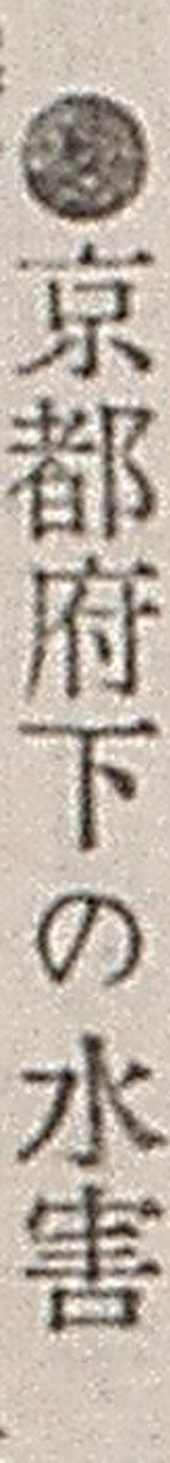●京都府下の水害
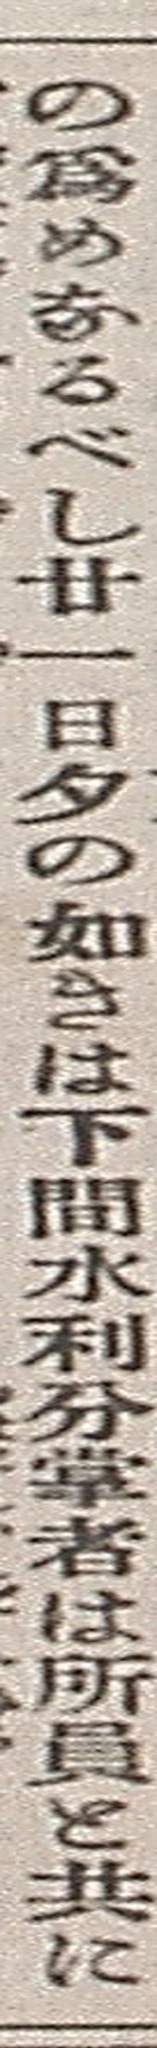の為めなるべし廿一日夕の如きは下間水利分掌者は所員と共に
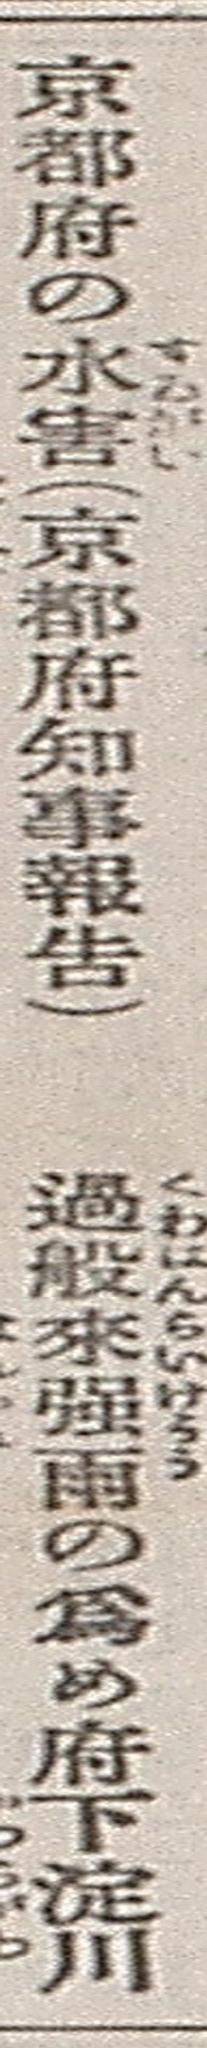京都府の水害過般來強雨の為め府下淀川
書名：風俗畫報臨時増刊第百二十八號　洪水被害録（下）
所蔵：東京大学地震研究所図書室 Earthquake Research Institute Library, The University of Tokyo, JAPAN
